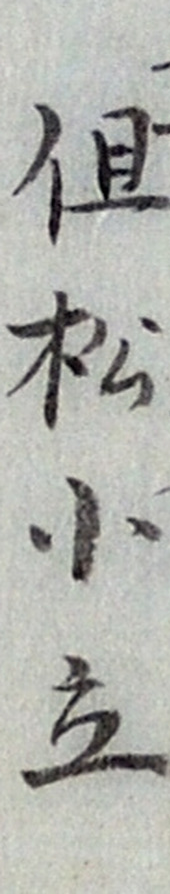但松小立
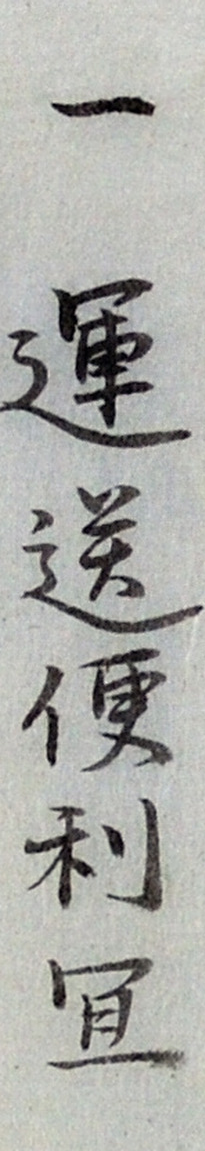一運送便利宜
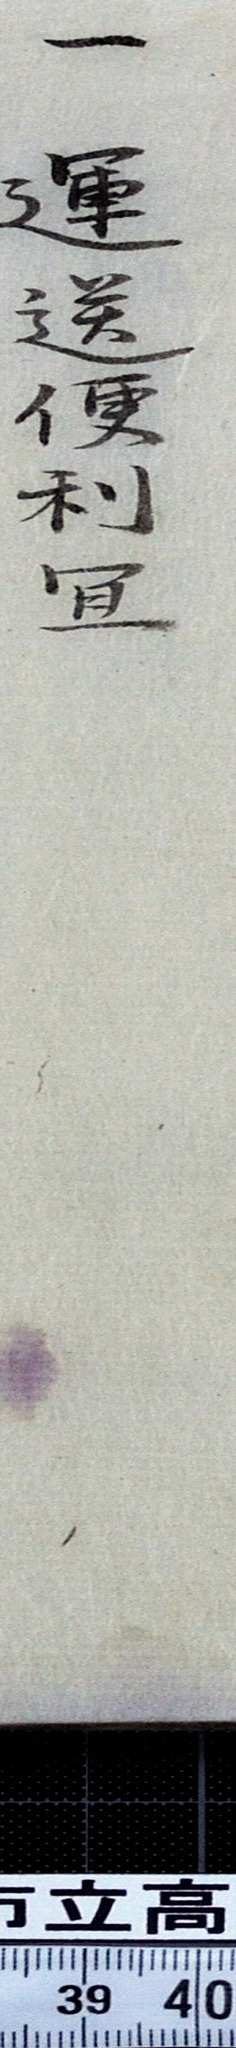一運送便利宜
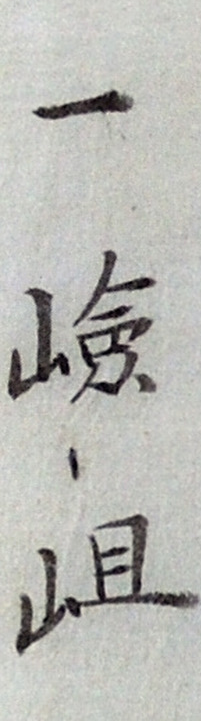一嶮岨

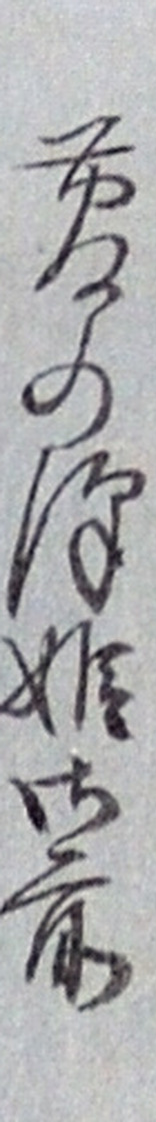葦の澤姫御前
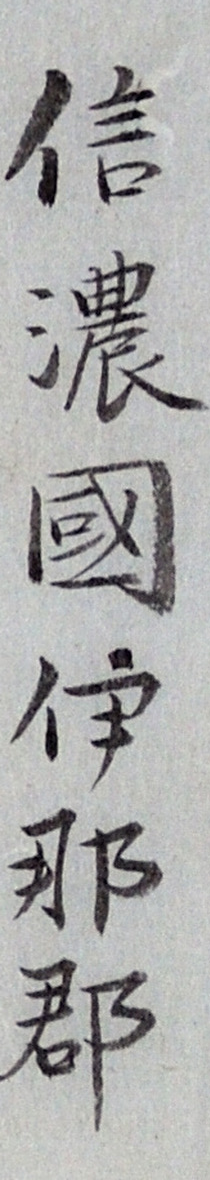信濃国伊那郡
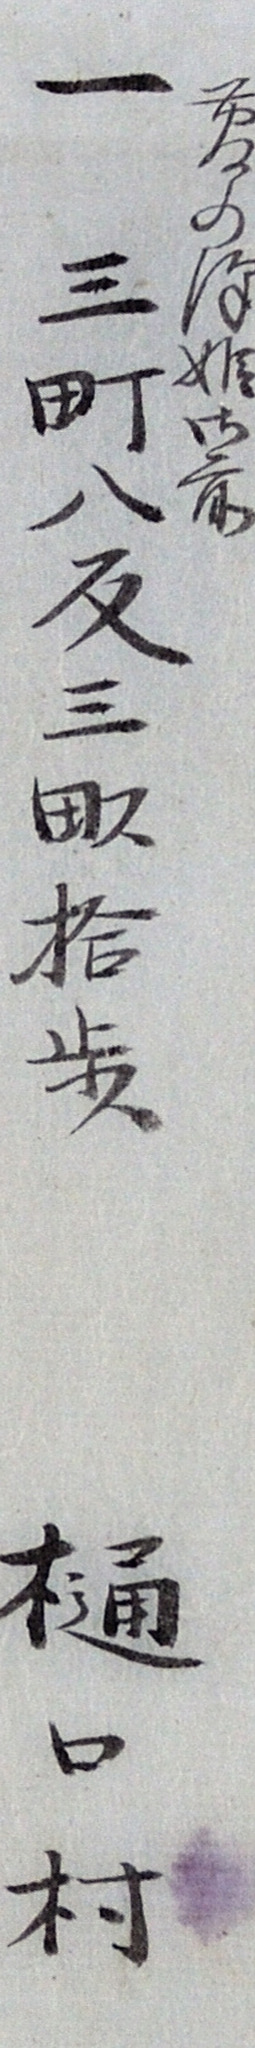一三町八反三㽗拾歩樋口村
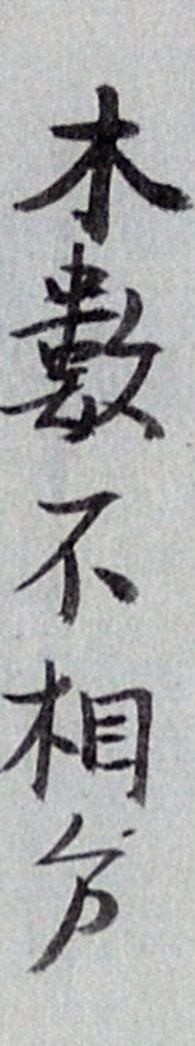木数不相分
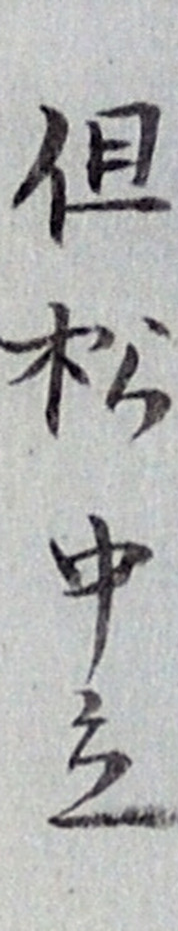但松中立
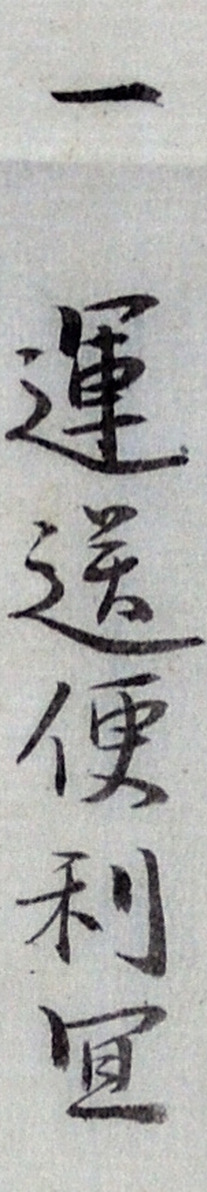一運送便利宜
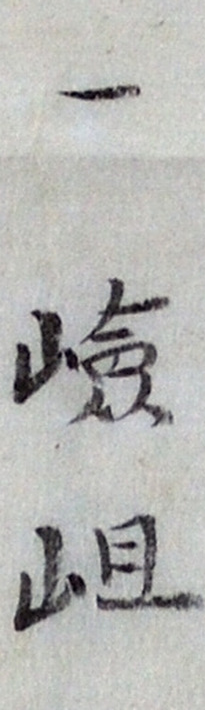一嶮岨

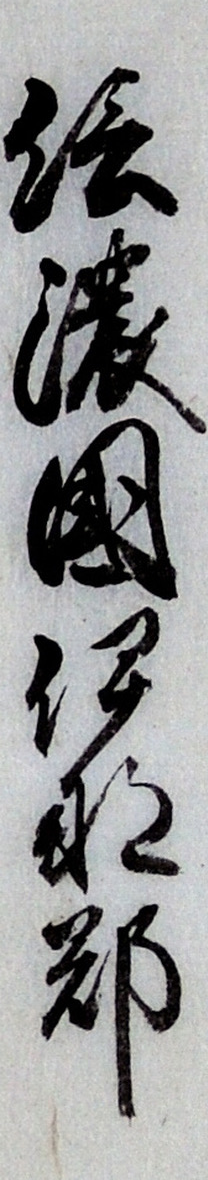信濃国伊那郡
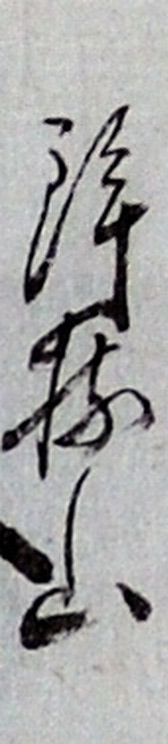鉾持山
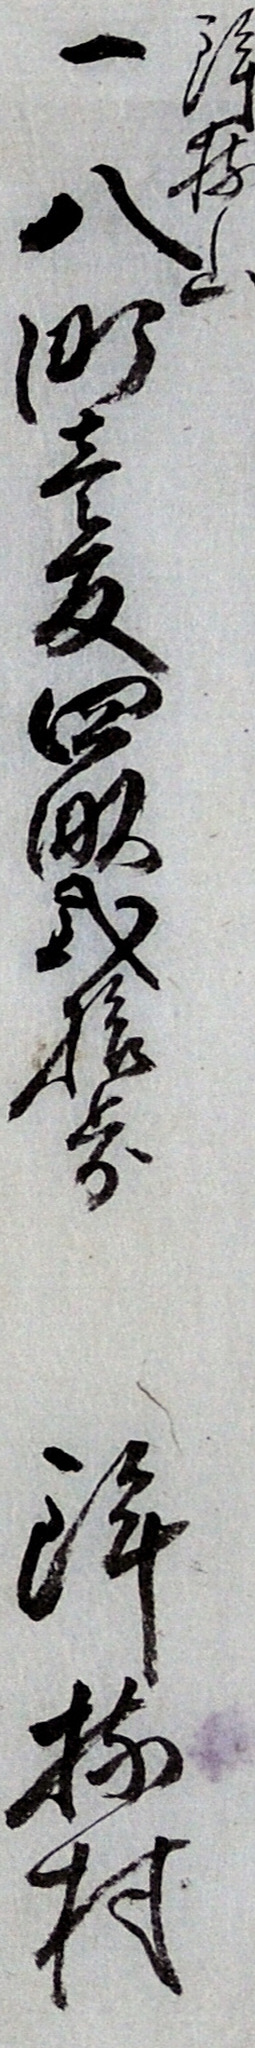一八町壱反四㽗拾歩鉾持村
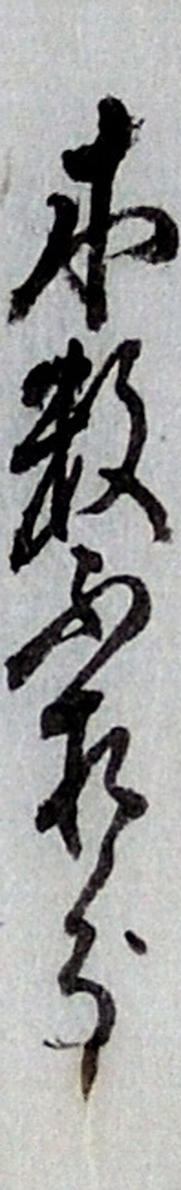木数不相分
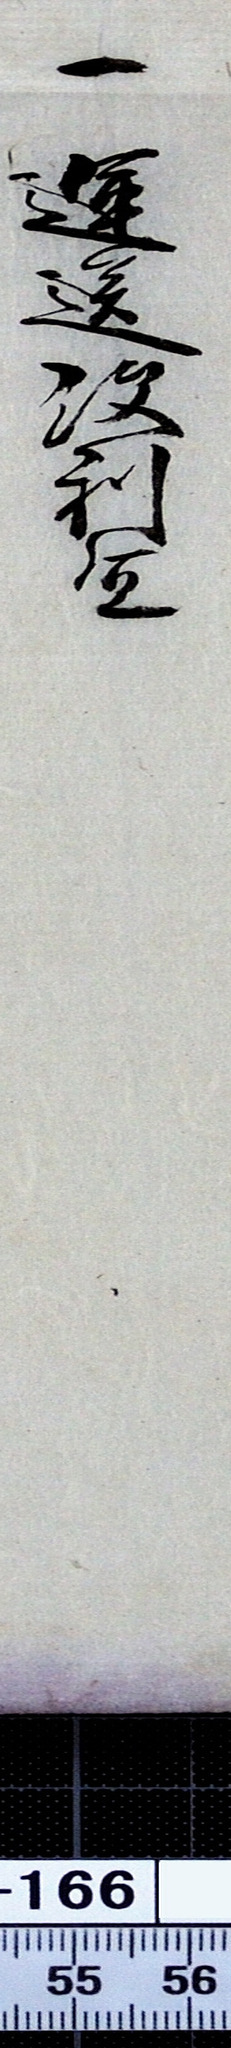一運送便利宜
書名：官林反別帳
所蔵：伊那市立高遠町図書館・合同会社AMANE
